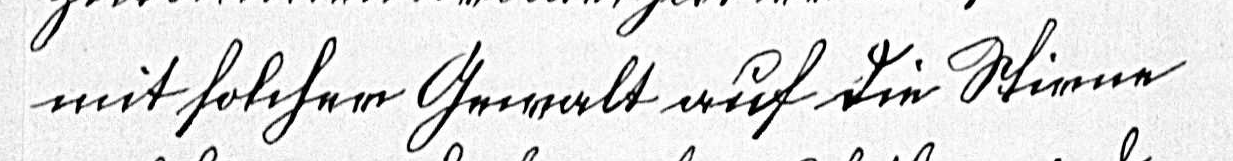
mit solcher Gewalt auf die Stirne
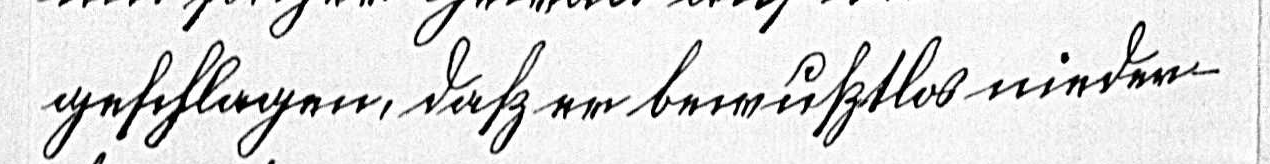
geschlagen, daß er bewußtlos nieder
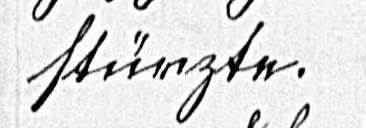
stürzte.
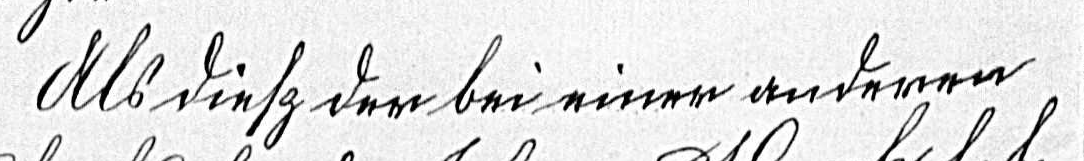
Als dieß der bei einer anderen
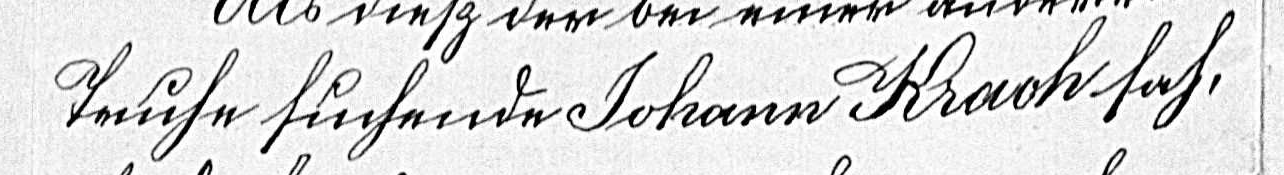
Truhe suchende Johann Krach sah,
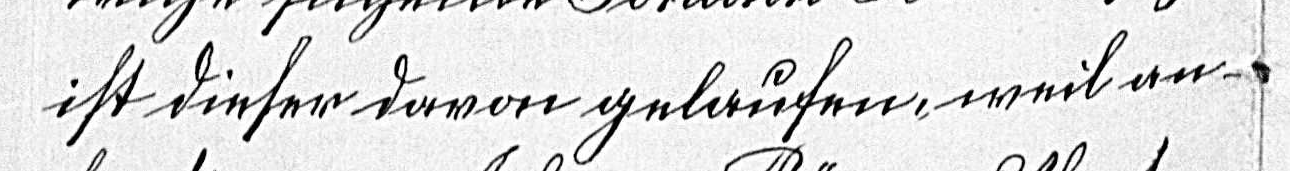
ist dieser davon gelaufen, weil an¬
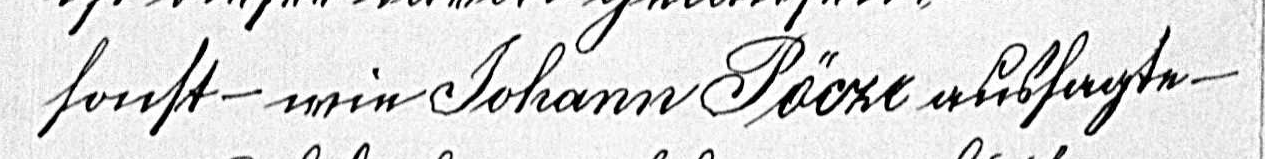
sonst – wie Johann Pöcze aussagte –
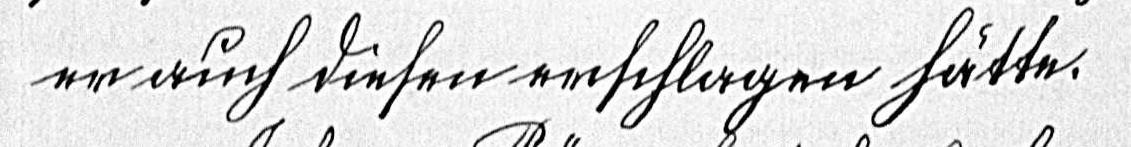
er auch diesen erschlagen hätte.
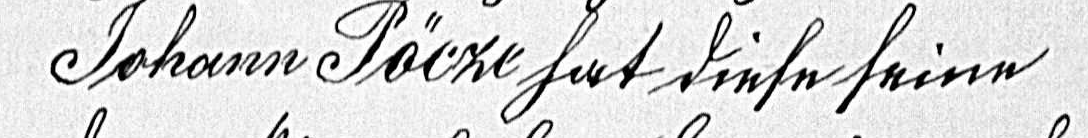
Johann Pöcze hat diese seine
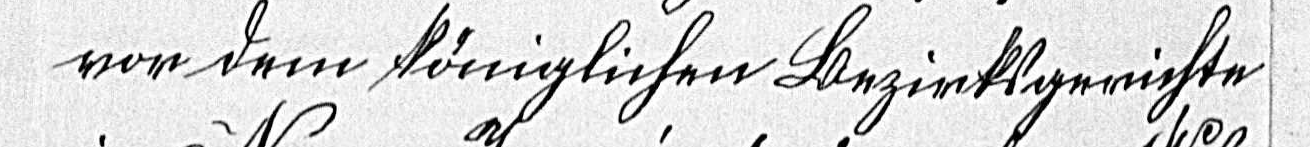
vor dem königlichen Bezirksgerichte
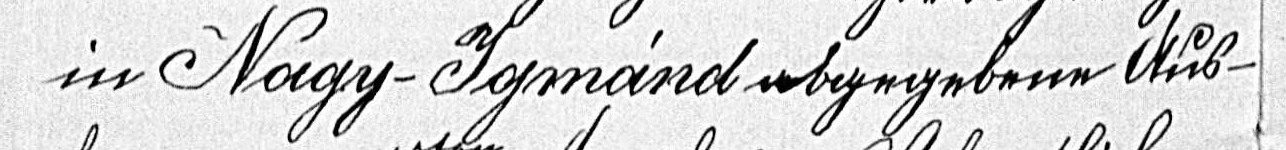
in Nagy-Igmánd abgegebene Aus¬
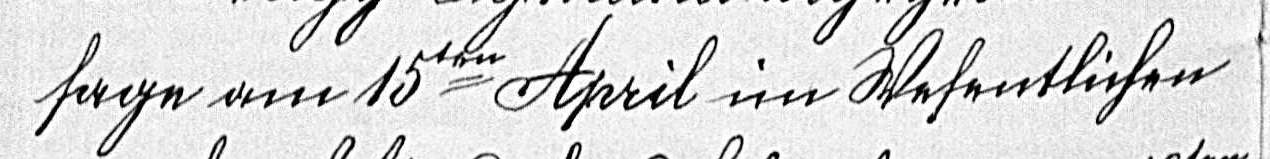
sage am 15ten April im Wesentlichen
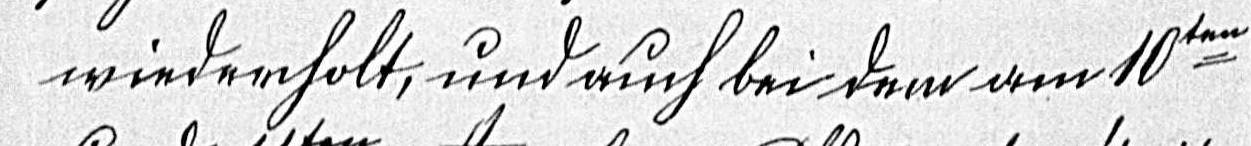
wiederholt, und auch bei dem am 10ten
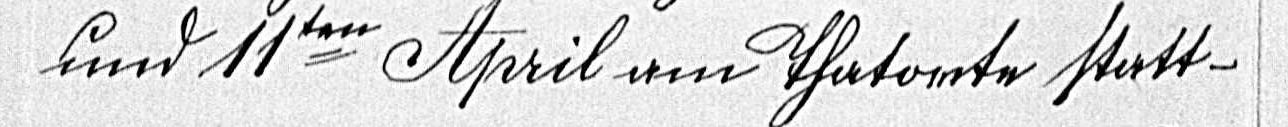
und 11ten April am Thatorte statt¬
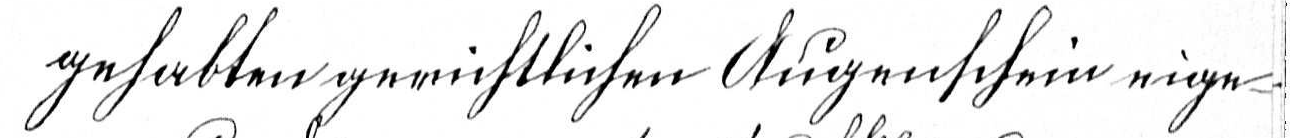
gehabten gerichtlichen Augenschein eige¬
